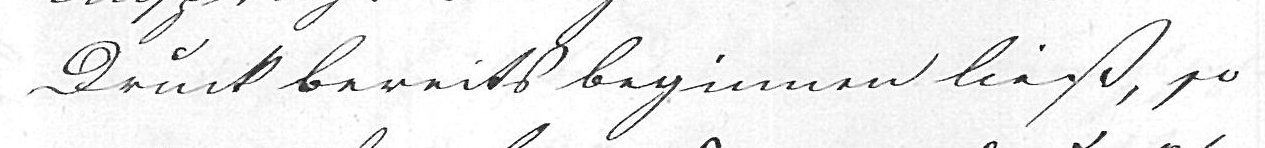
Druck bereits beginnen ließ, so
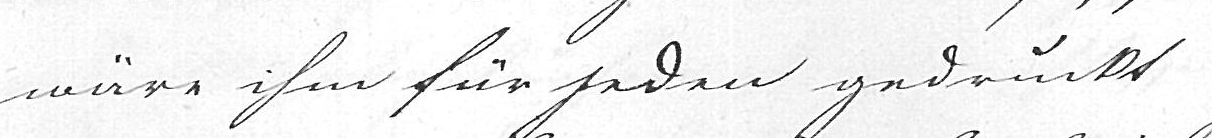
wäre ihm für jeden gedruckt
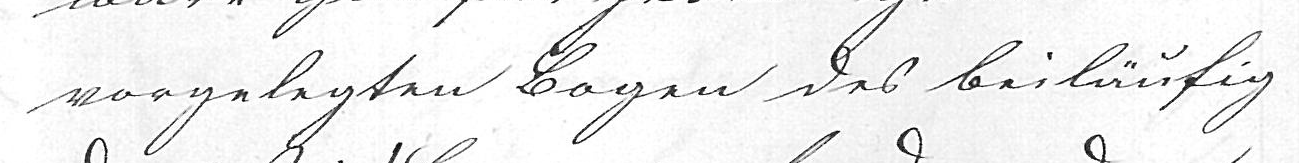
vorgelegten Bogen des beiläufig
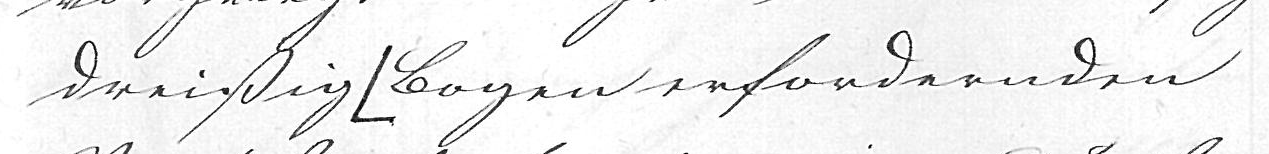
dreißig Bogen erfordernden
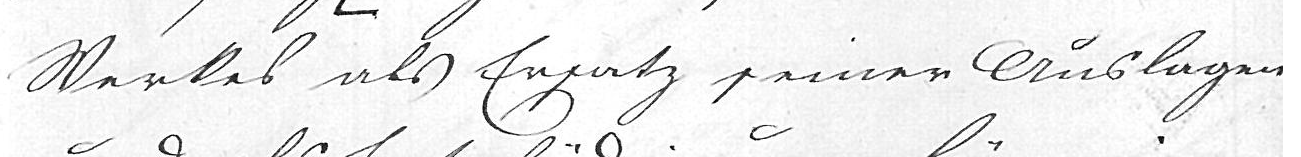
Werkes als Ersatz seiner Auslagen
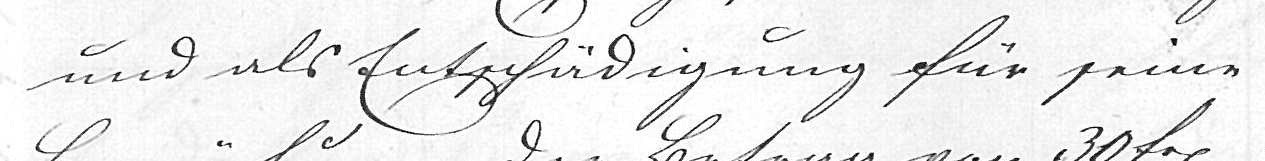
und als Entschädigung für seine
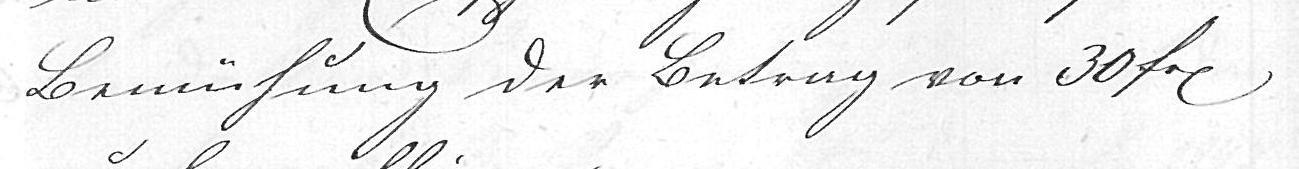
Bemühung der Betrag von 30 fr
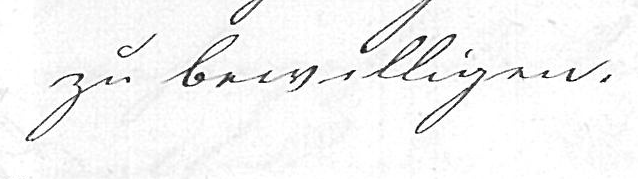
zu bewilligen.
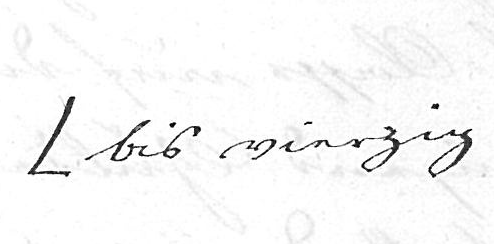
bis vierzig
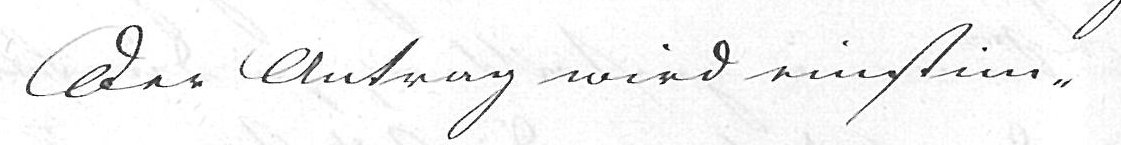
Der Antrag wird einstim-
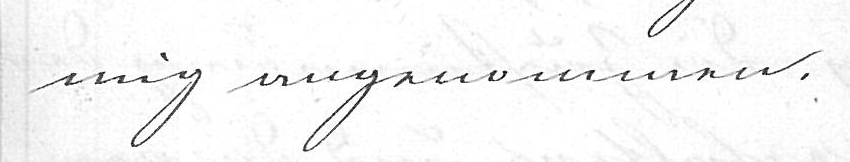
mig angenommen.
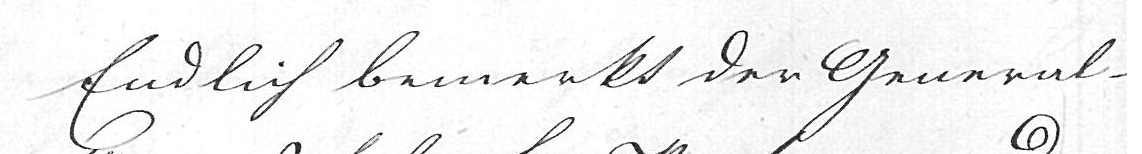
Endlich bemerkt der General-
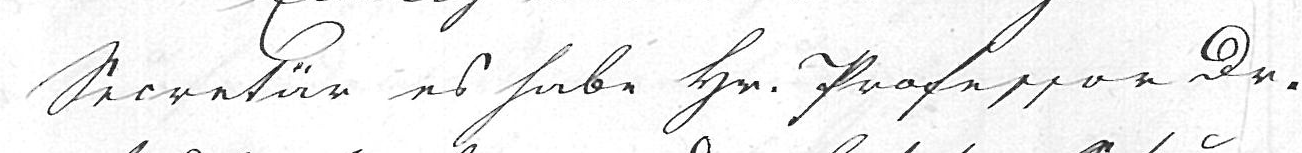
Secretär es habe Hr. Professor Dr.
